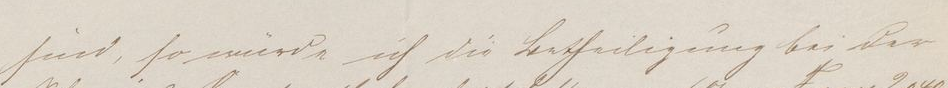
sind, so würde ich die Betheiligung bei der
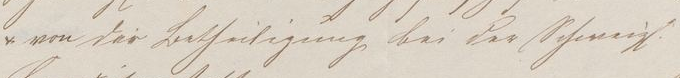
& von der Betheiligung bei der Schweiz.
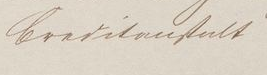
Creditanstalt
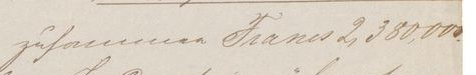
zusammen Francs 2,380,000.
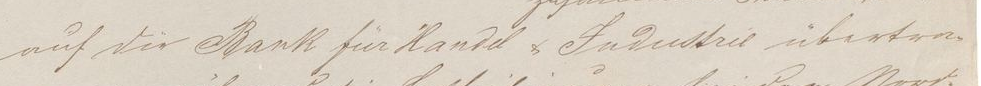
auf die Bank für Handel & Industrie übertra-
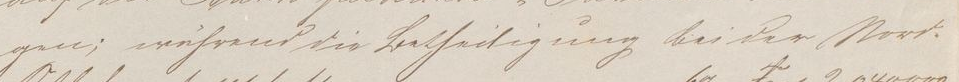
gen; während die Betheiligung bei der Nord-
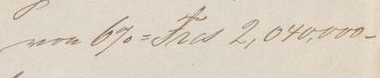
von 6% = Frcs 2,040,000.
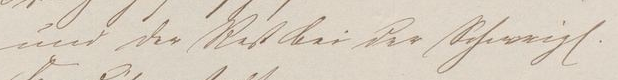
und der Rest bei der Schweiz.
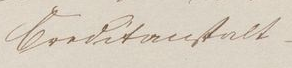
Creditanstalt "
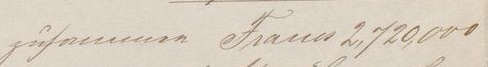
zusammen Francs 2,720,000
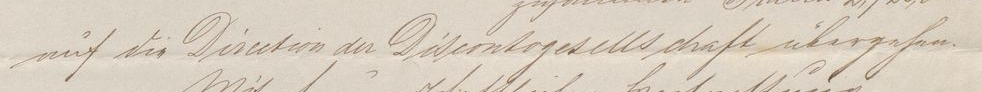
auf die Direction der Discontogesellschaft übergehen.
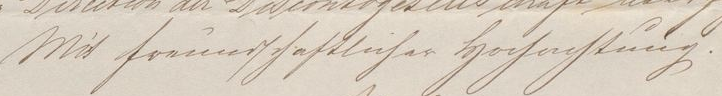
Mit freundschaftlicher Hochachtung.
